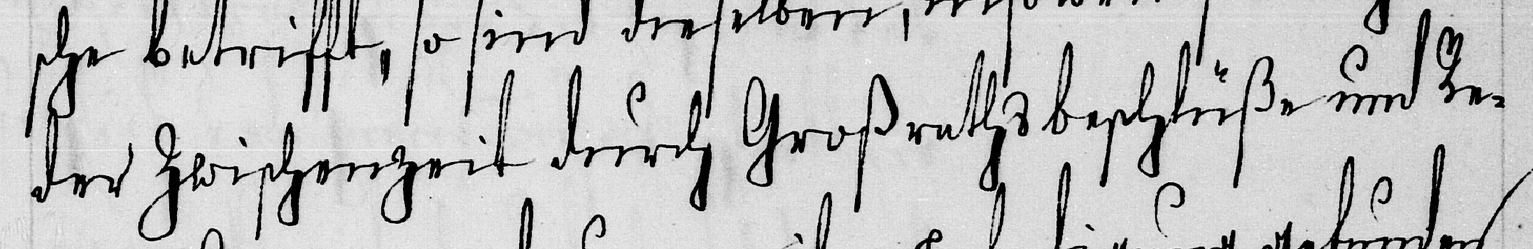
der Zwischenzeit durch Großrathsbeschlüße und Re¬
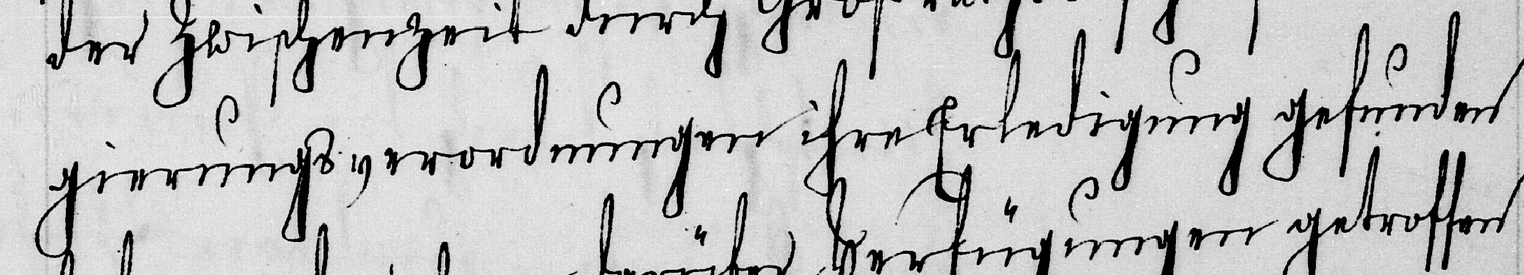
gierungsverordungen ihre Erledigung gefunden
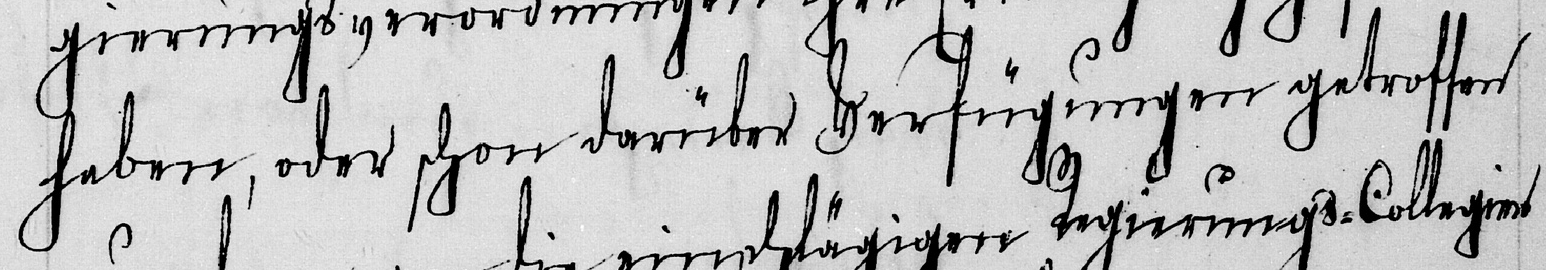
haben, oder schon darüber Verfügungen getroffen
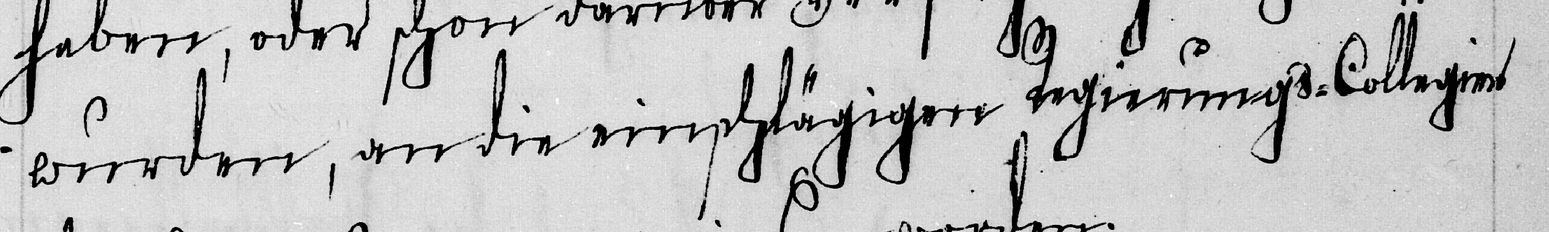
wurden, an die einschlägigen Regierungs-Collegien
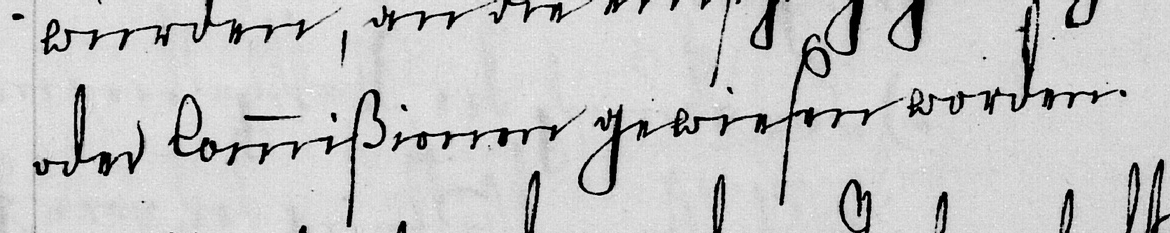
oder Commißionen gewiesen worden.
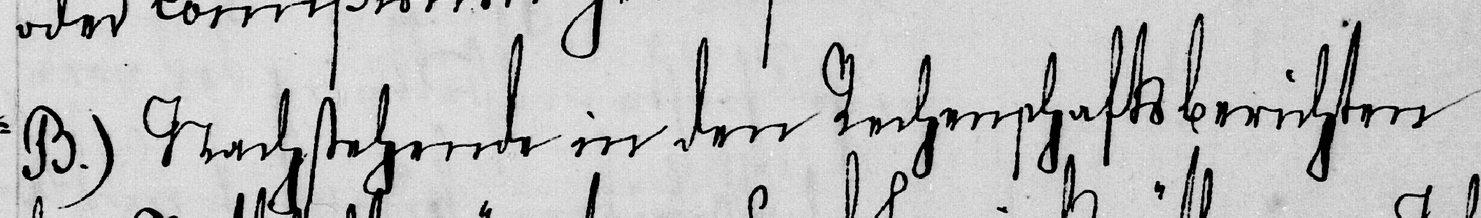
B.) Nachstehende in den Rechenschaftsberichten
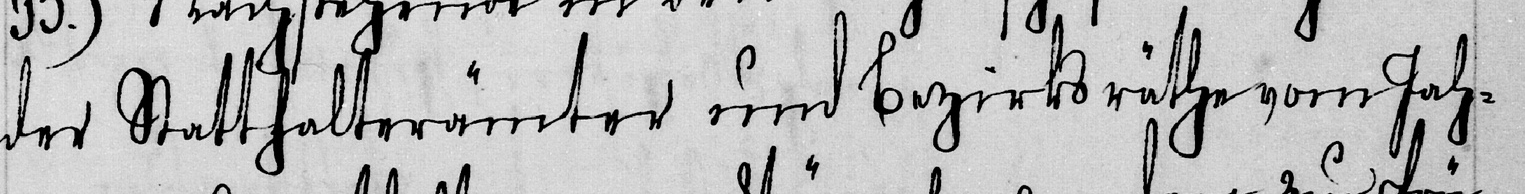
der Statthalterämter und Bezirksräthe vom Jah¬
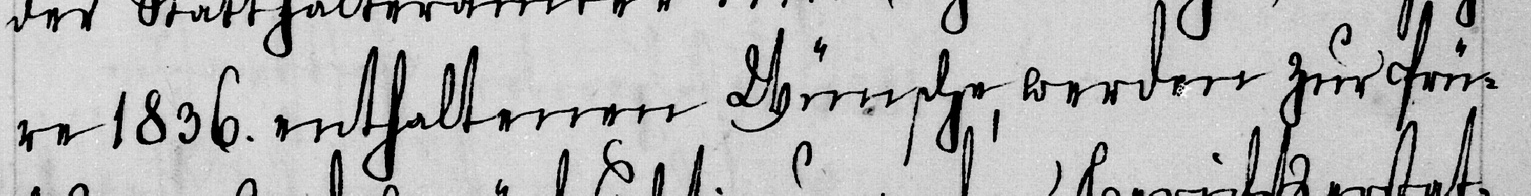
r 1836. enthaltenen Wünsche, werden zur Prü¬
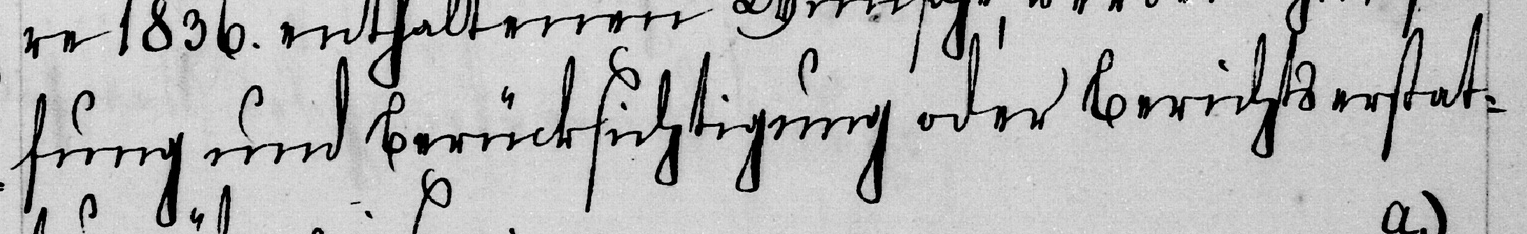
fung und Berücksichtigung oder Berichtserstat¬
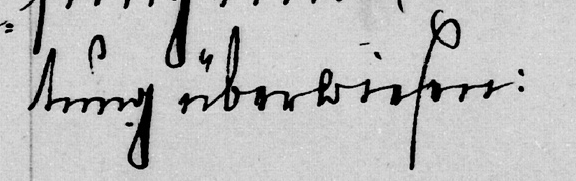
tung überwiesen:
